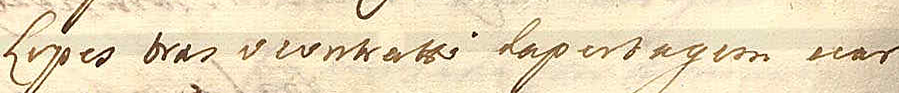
Lopes tras o contratto da portagem e car
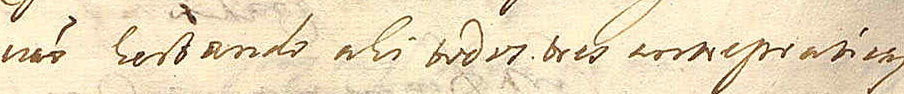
uaõ E estando ahi todos tres antre praticas
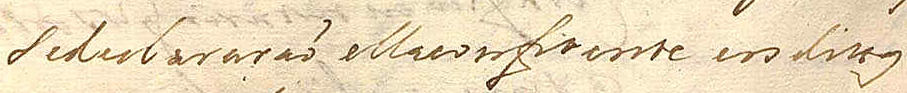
se declararaõ elle confitente e os dittos
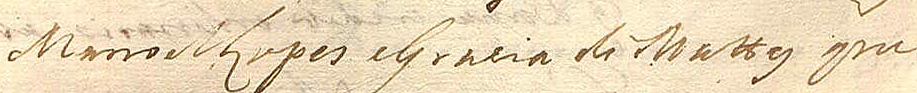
Manoel Lopes e Gracia de Mattos que
